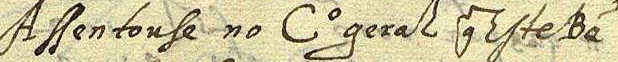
Assentouse no Co geral q̄ este Bē
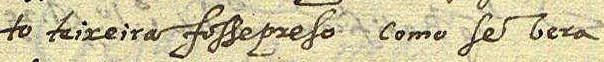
to teixeira fosse preso como se vera
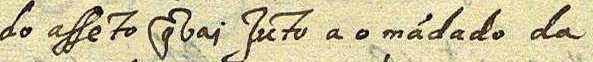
do assēto q̄ vai Jūto ao mādado da
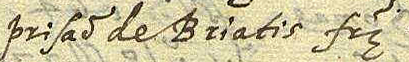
prisaõ de Briatis frz̄
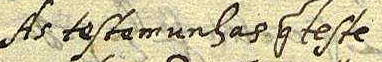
As testemunhas q̄ teste
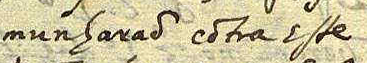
munharaõ cōtra Este
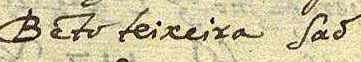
Bēto teixeira saõ
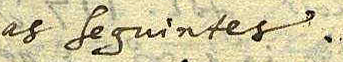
as seguintes.
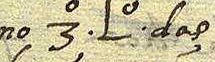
No 3o. Lo. das
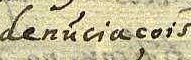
denūciaçois̄
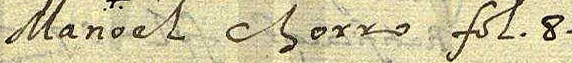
Manoel chorro fol. 8
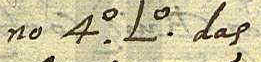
No 4o. Lo. das
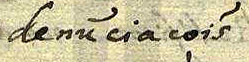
denūciaçois̄
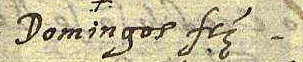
Domingos frz̄ -
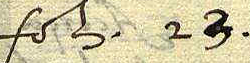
foL. 23.
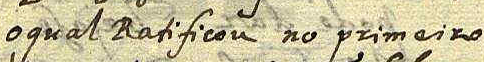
o qual Ratificou no primeiro
